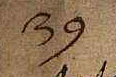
39
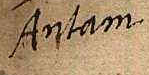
Antam
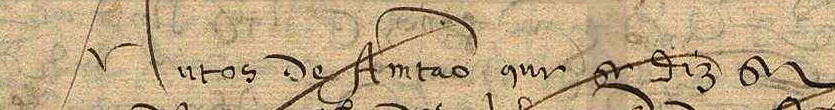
Autos de Amtão que se diz ser
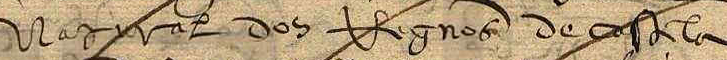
natural dos Regnos de castela
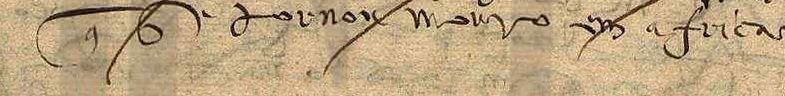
q̄ se tornou mouro em africa
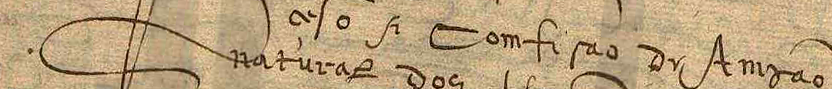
Ꝓceso e Comfisão de Amtão
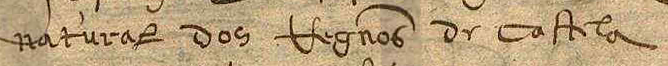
natural dos Regn̄os de Castela
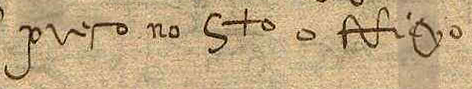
preso no Sto officyo
